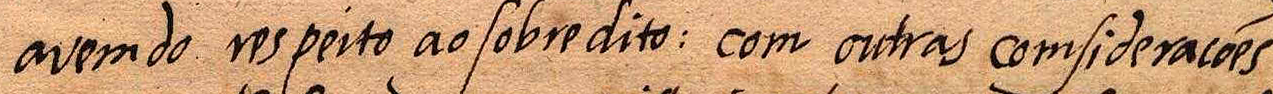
avendo respeito ao sobredito: com outras consideraçoẽs
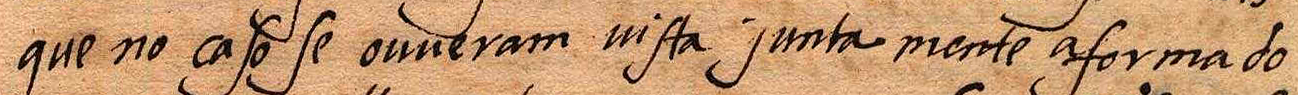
que no caso se ouueram uista juntamente a forma do
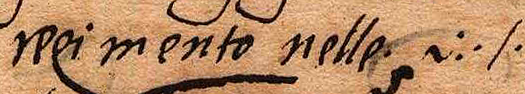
regimento nelle.
